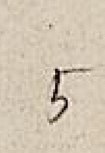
5
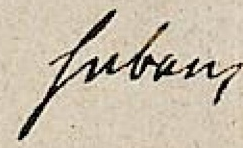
haben,
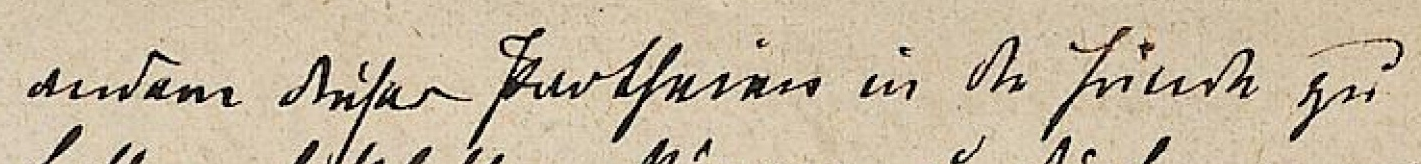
andern dieser Partheien in die Häinde zu
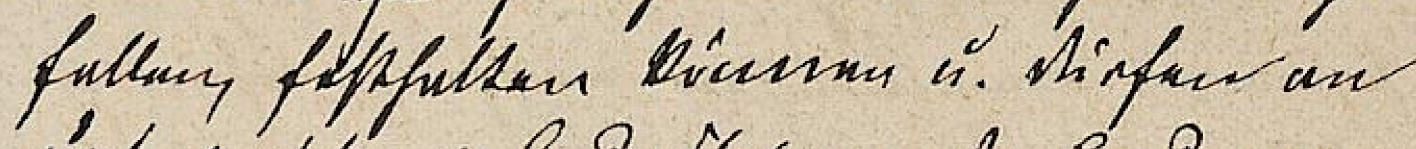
fallen, festhalten können u. diesen an
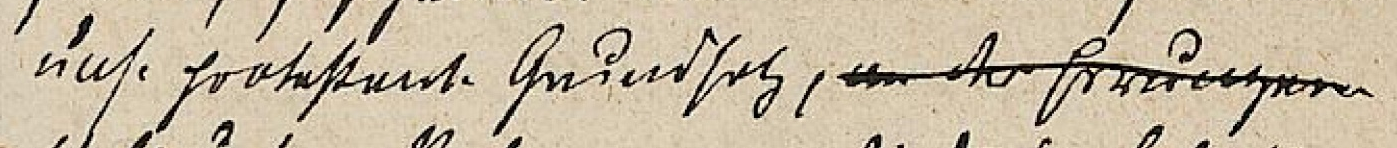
uns. protestant. Grundsalz, an der Errungen¬
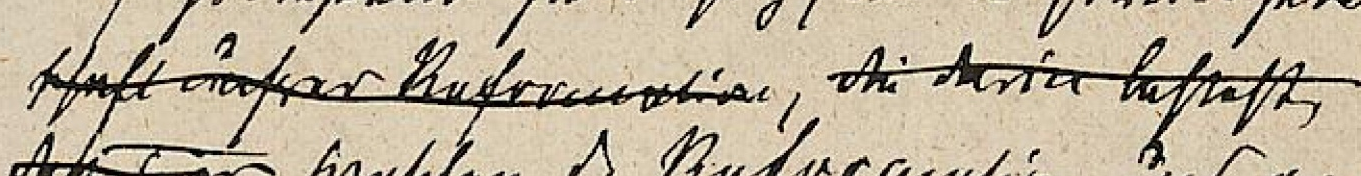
schaft unsrer Reformation, die darin besteht,
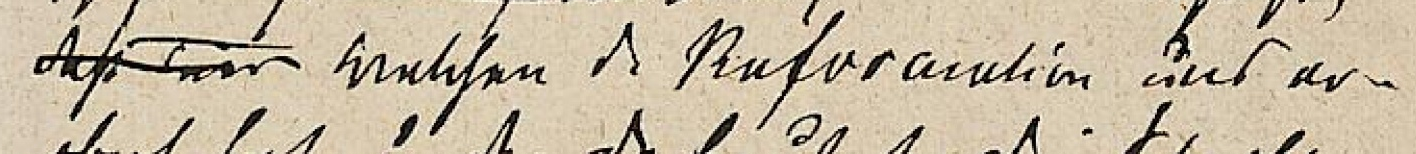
daß wir welchen d. Reformation uns er¬
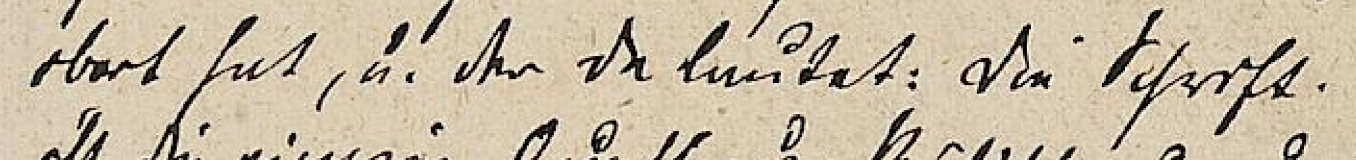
obert hat, u. der da lautet: Die Schrift.
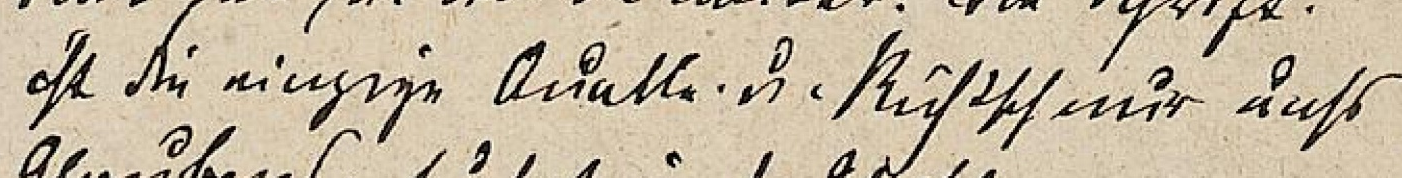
ist die einzige Quelle. u. Richtschnur unss
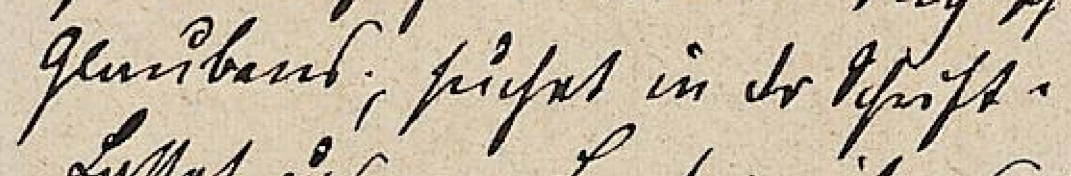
Glaubens; suchet in der Schrift.
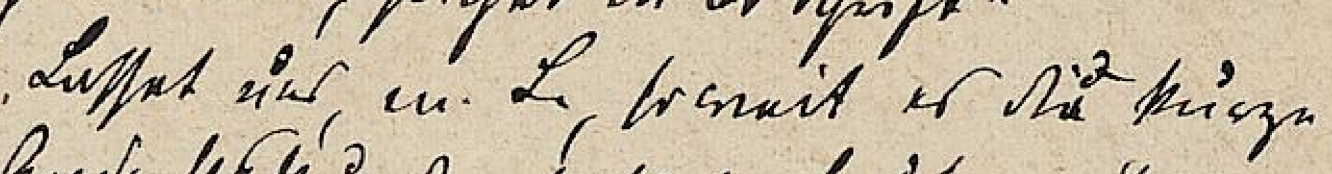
Lasset uns, m. L., soweit es die kurze
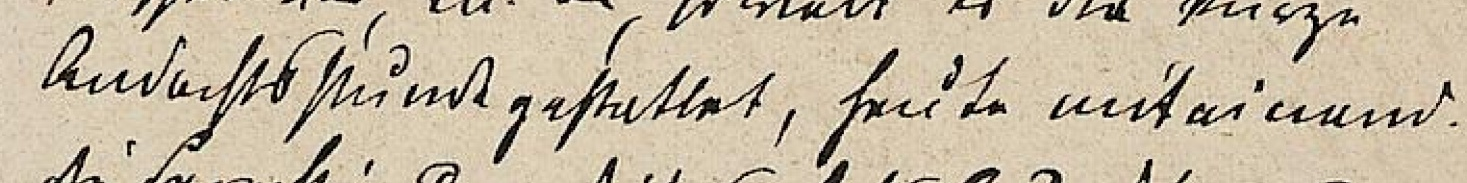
Andachtsstunde gestattet, heute miteinand.
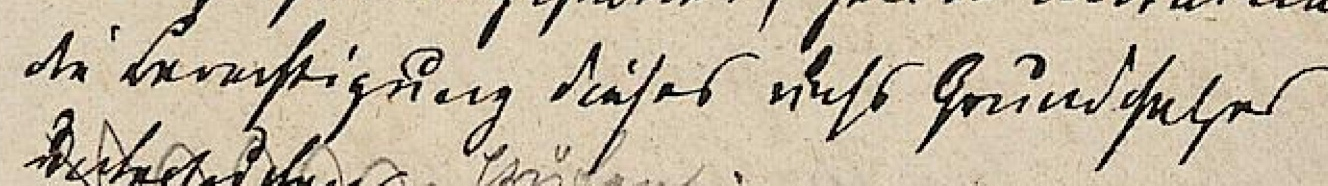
die Berechtigung dieses unss Grundsatzes
